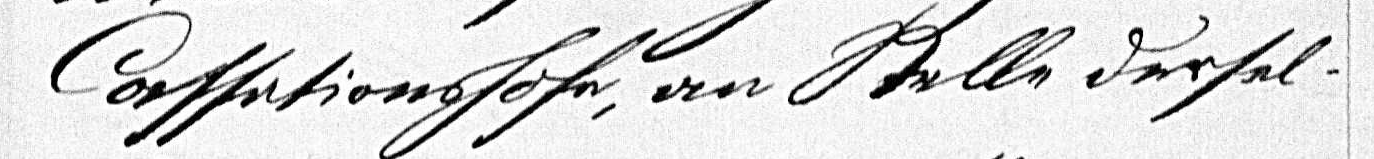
Cassationshofe, an Stelle dersel¬
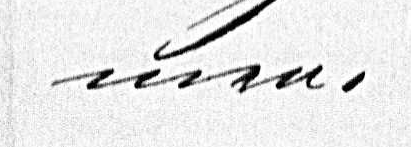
men.
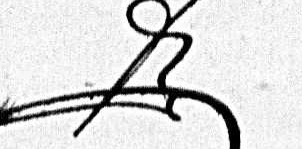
FJ
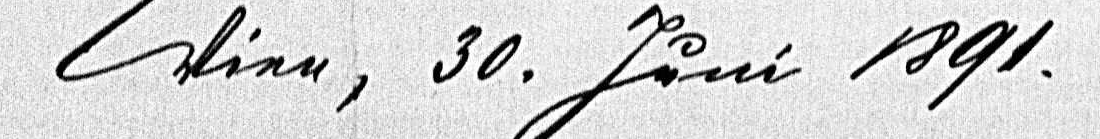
Wien, 30 Juni 1891
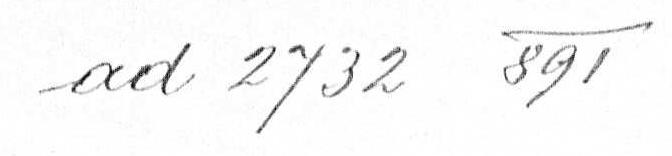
Ad 2732 1891
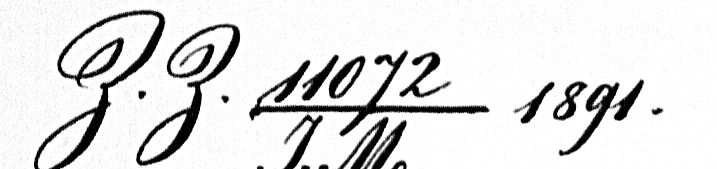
ZZ 11072/ 1891
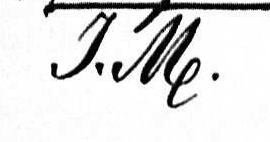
JM
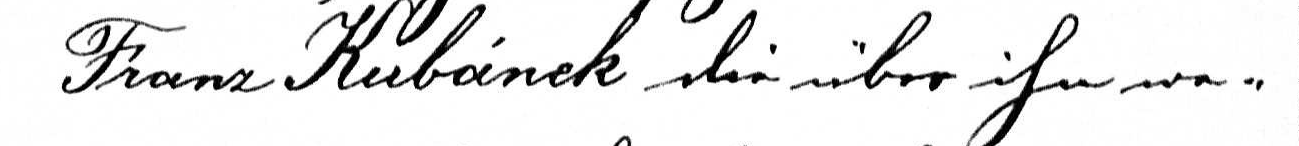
Franz Kubánek die über ihn we¬
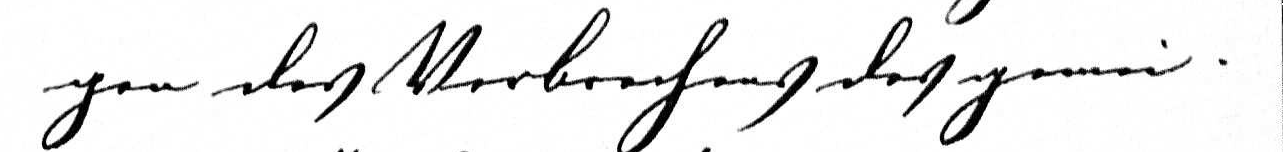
gen des Verbrechens des gemei¬
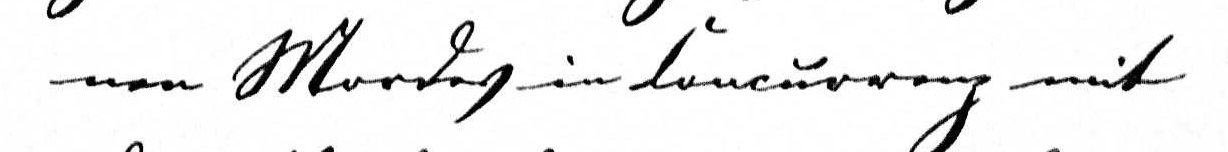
nen Mordes in Concurrenz mit
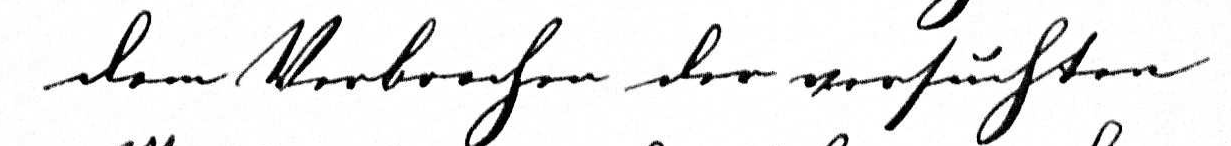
dem Verbrechen der versuchten
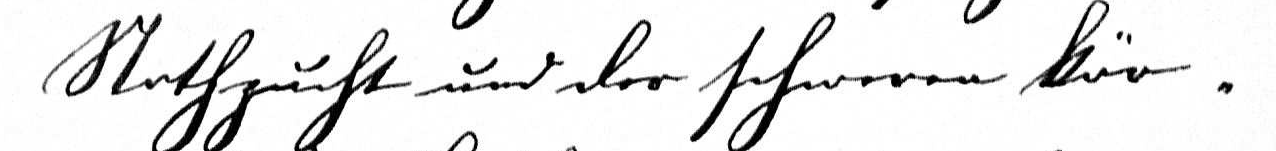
Nothzucht und der schweren kör¬
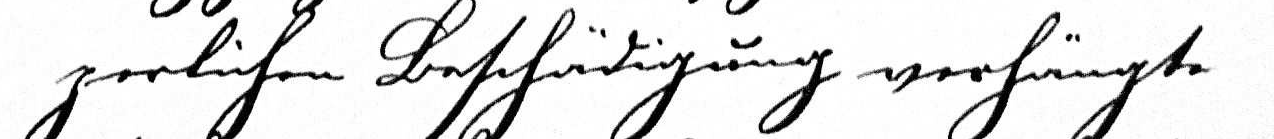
perlichen Beschädigung verhängte
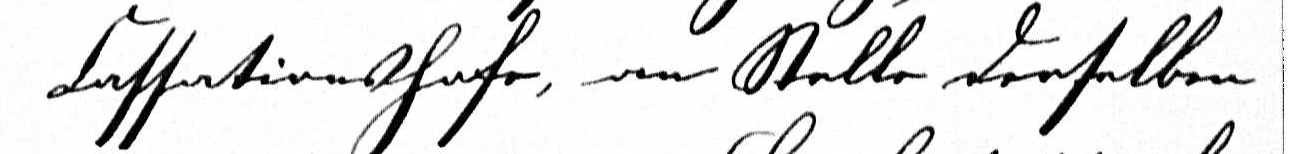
Cassationshofe, an Stelle derselben
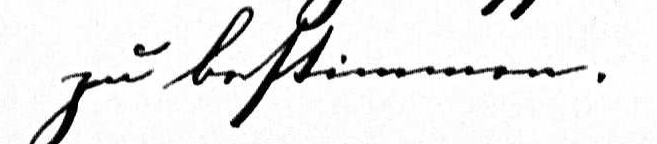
zu bestimmen.
